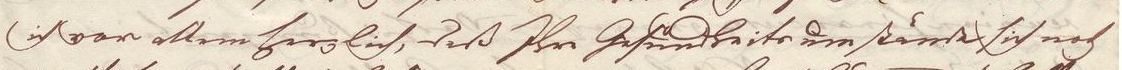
ich vor allem herzlich, daß Ihre Gesundheitsumstände sich noch
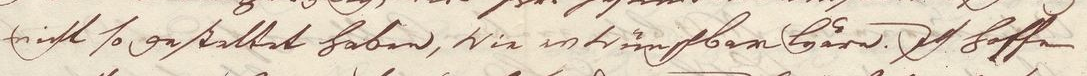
nicht so gestaltet haben, wie es wünschbar wäre. Ich hoffe
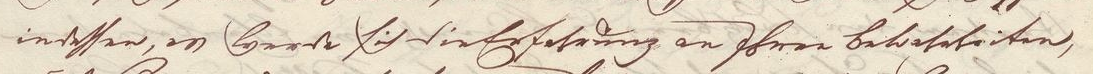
indessen, es werde sich die Erfahrung an Ihnen bewahrheiten,
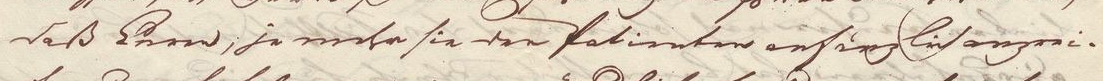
daß Curen, je mehr sie den Patienten anfänglich angrei-
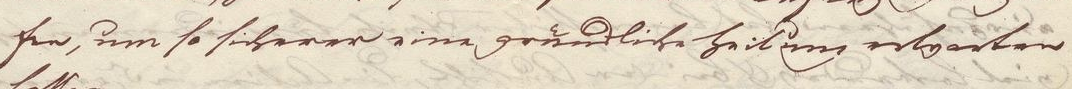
fen, um so sicherer eine gründliche Heilung erwarten
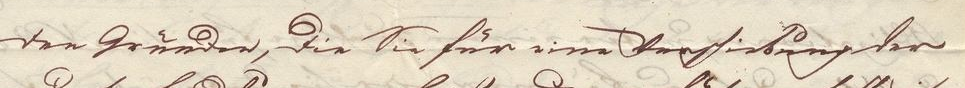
Den Gründen, die Sie für eine Verschiebung der
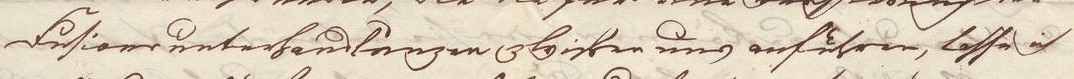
Fusionsunterhandlungen zwischen uns anführen, lasse ich
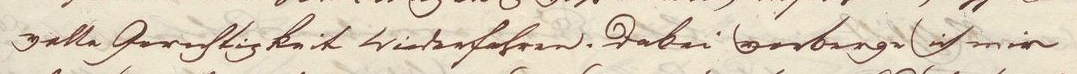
volle Gerechtigkeit wiederfahren. Dabei verberge ich mir
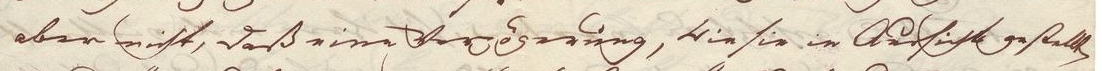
aber nicht, daß eine Verzögerung, wie sie in Aussicht gestellt
